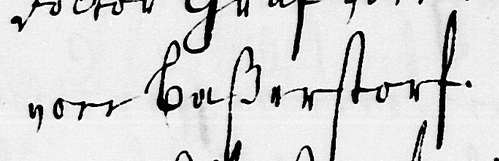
von Baßerstorf.
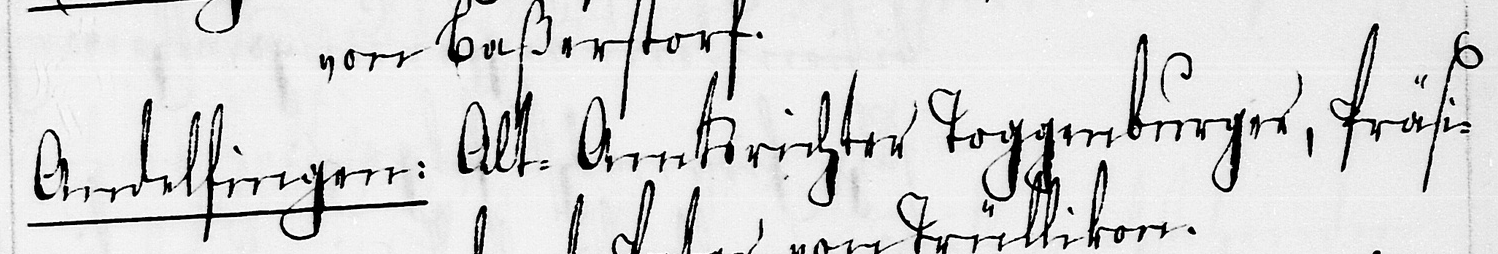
Andelfingen: Alt-Amtsrichter Toggenburger, Präsi¬
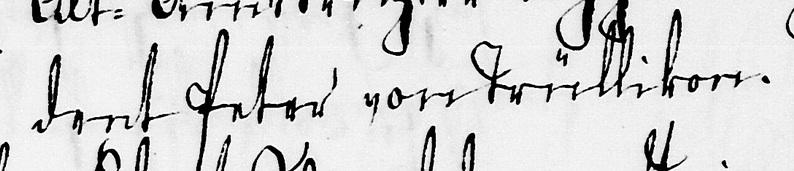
dent Peter von Trüllikon.
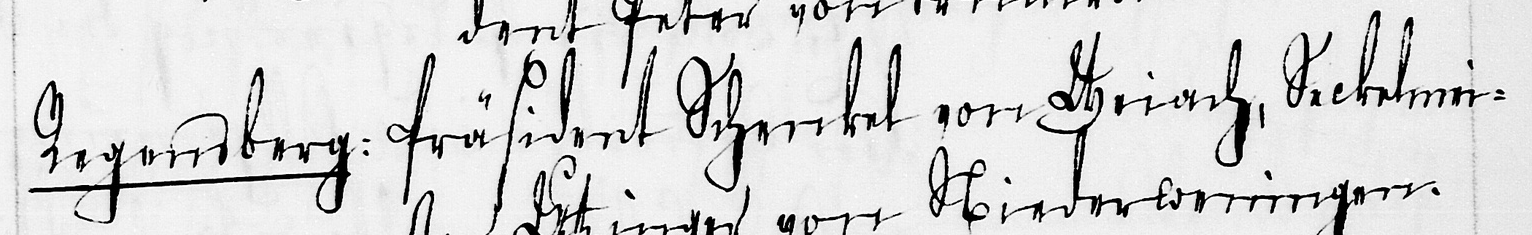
Regensberg: Präsident Schenkel von Weiach, Seckelmei¬
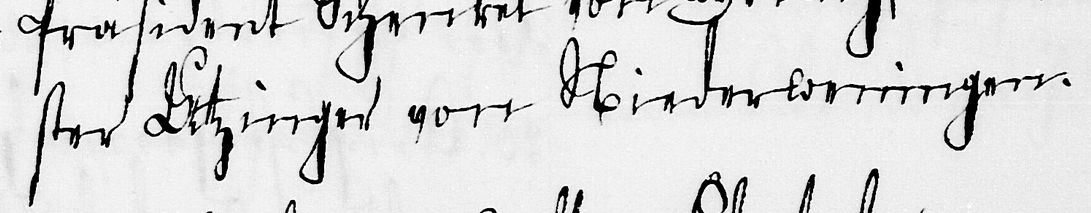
ster Utzinger von Niederweningen.
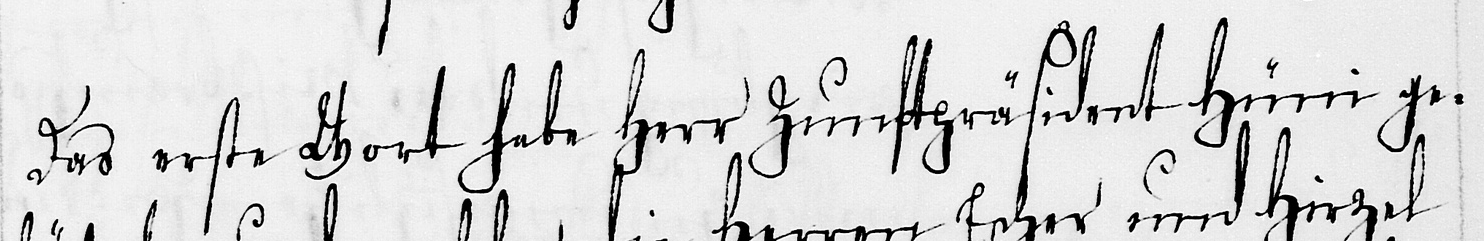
Das erste Wort habe Herr Zunftpräsident Hüni ge¬
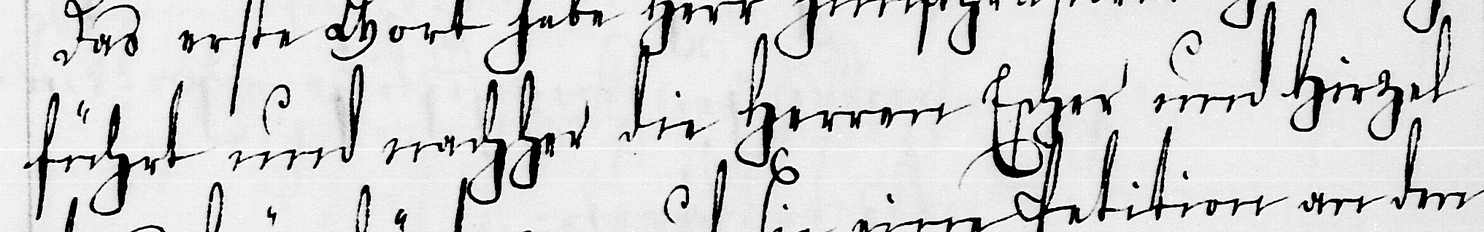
führt und nachher die Herren Escher und Hirzel
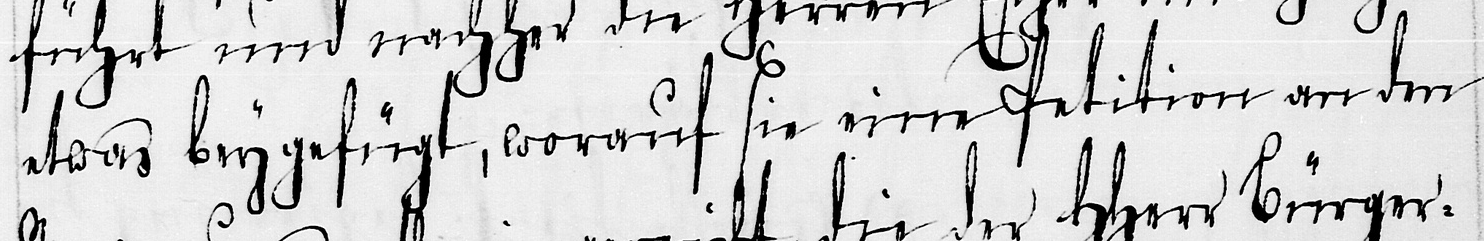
etwas beygefügt, worauf sie eine Petition an den
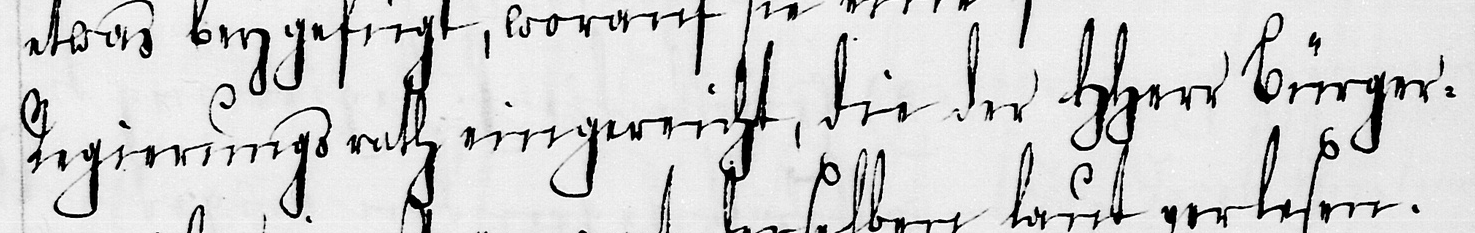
Regierungsrath eingereicht, die der HHerr Bürger¬
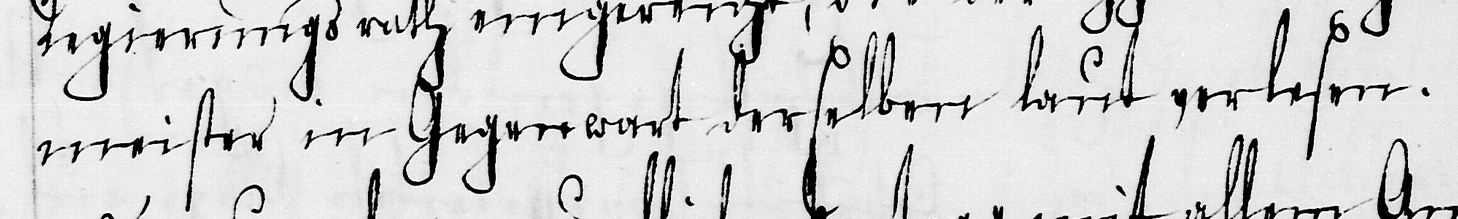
meister in Gegenwart derselben laut verlesen.
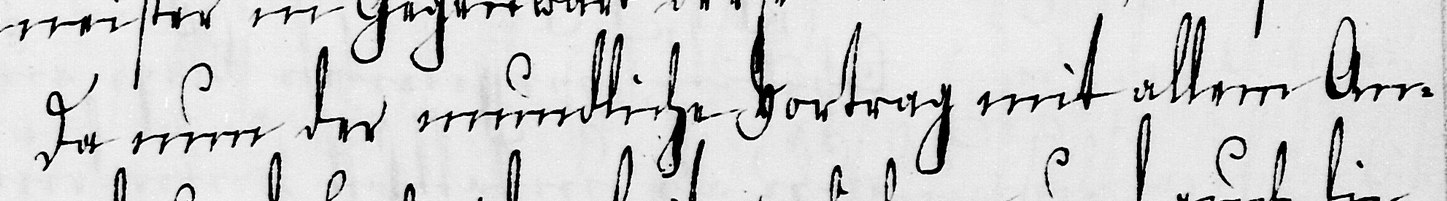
Da nun der mundliche Vortrag mit allem An¬
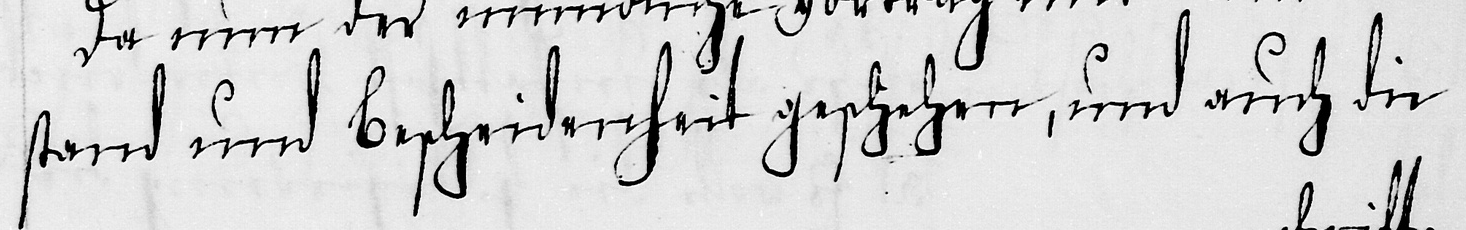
stand und Bescheidenheit geschehen, und auch die
